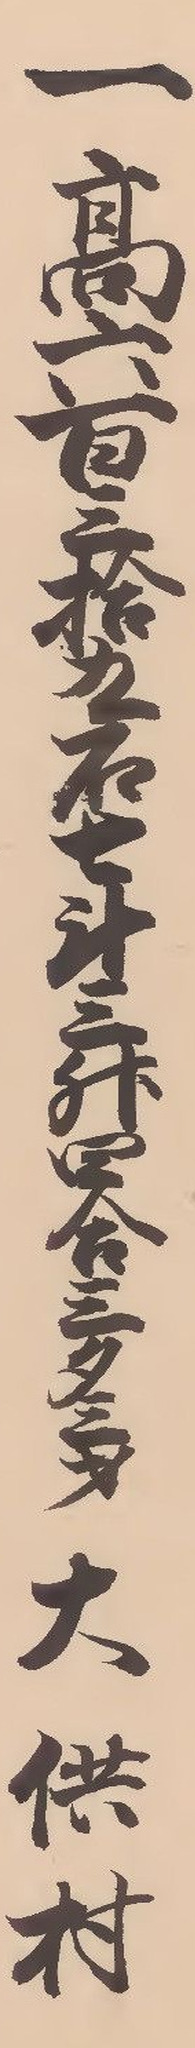一高六百三拾九石七斗三升四合三勺三才大供村
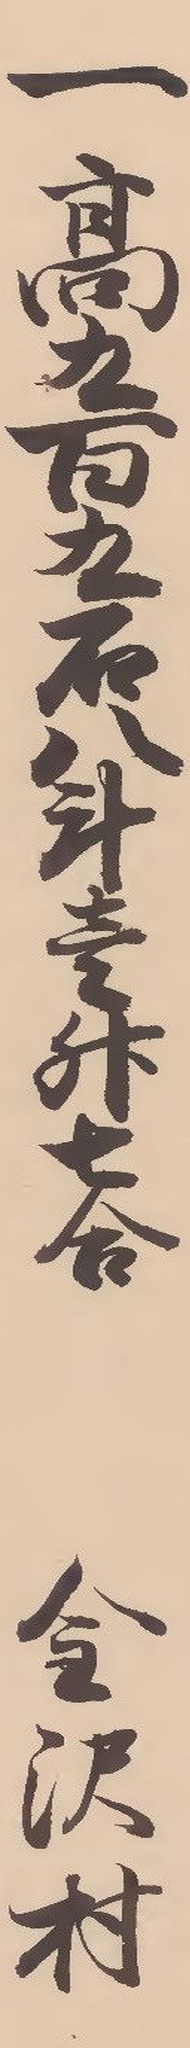一高九百九石八斗壱升七合金沢村
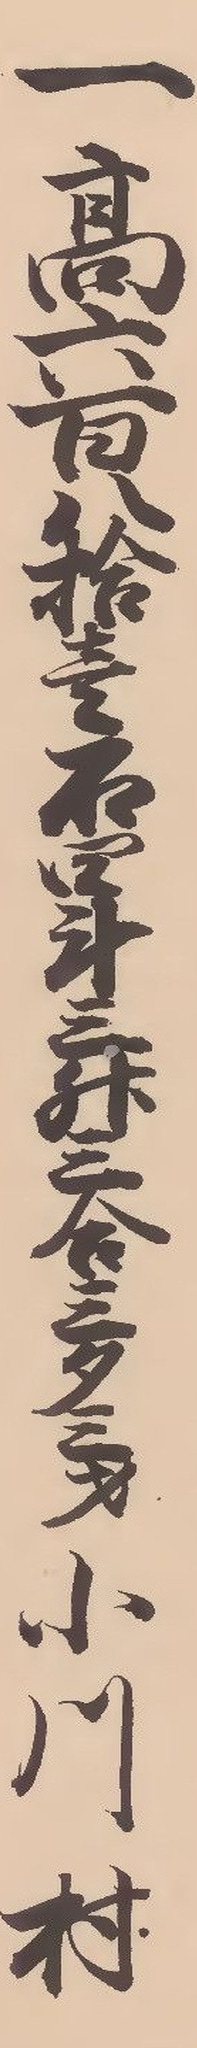一高六百八拾壱石四斗三升三合三勺三才小川村
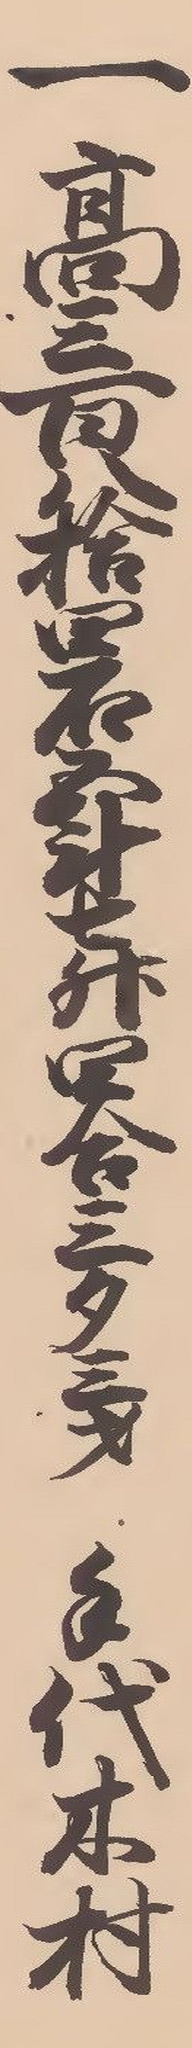一高三百八拾四石五斗七升四合三勺三才手代木村
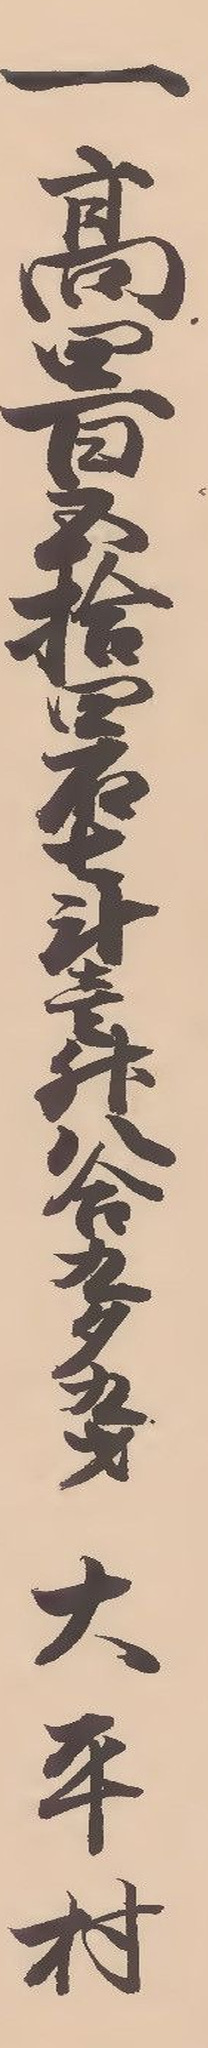一高四百五拾四石七斗壱升八合九勺九才大平村
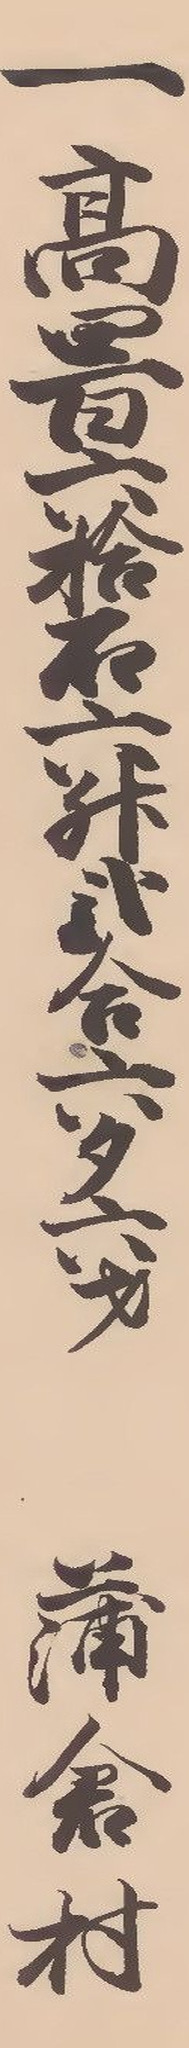一高四百六拾石六升弐合六勺六才蒲倉村
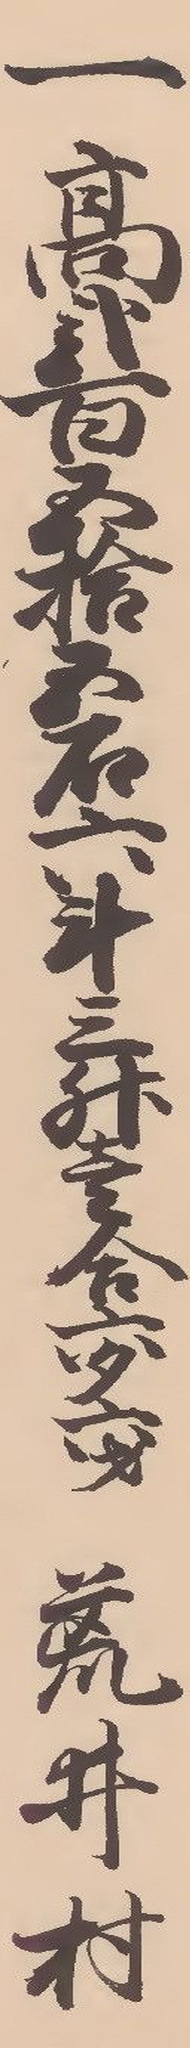一高弐百五拾五石六斗三升壱合六勺六才荒井村
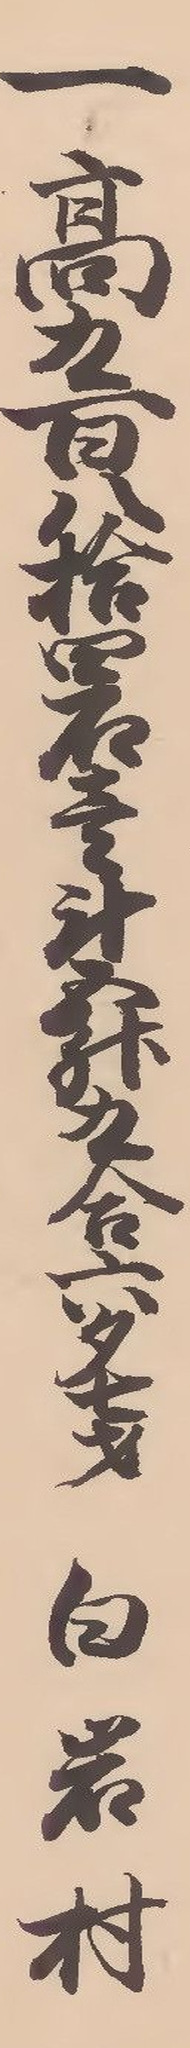一高九百八拾四石壱斗五升九合六勺七才白岩村

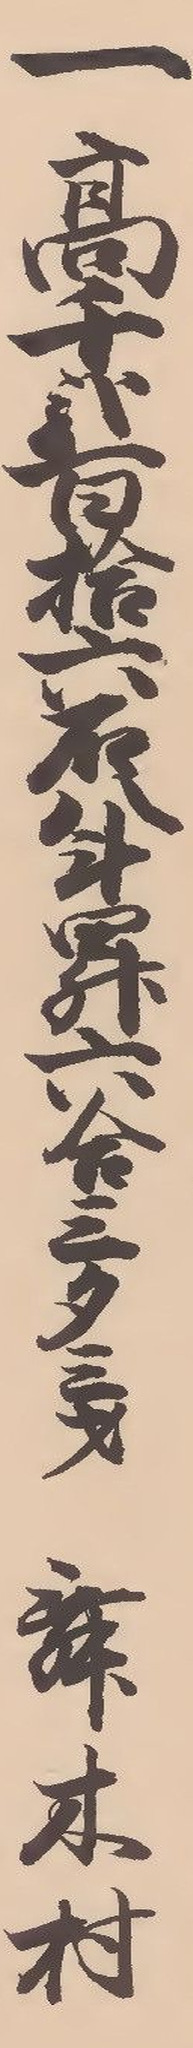一高千弐百拾六石八斗四升六合三勺三才舞木村
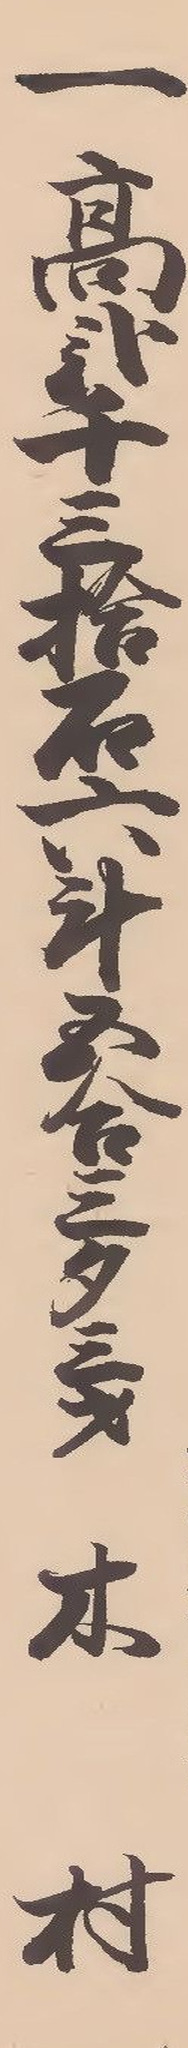一高弐千三拾石六斗五合三勺三才木村
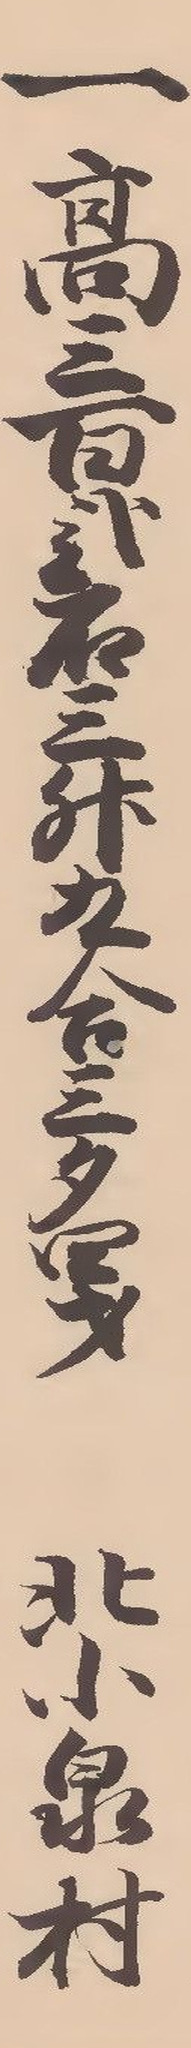一高三百弐石三升九合三勺四才北小泉村
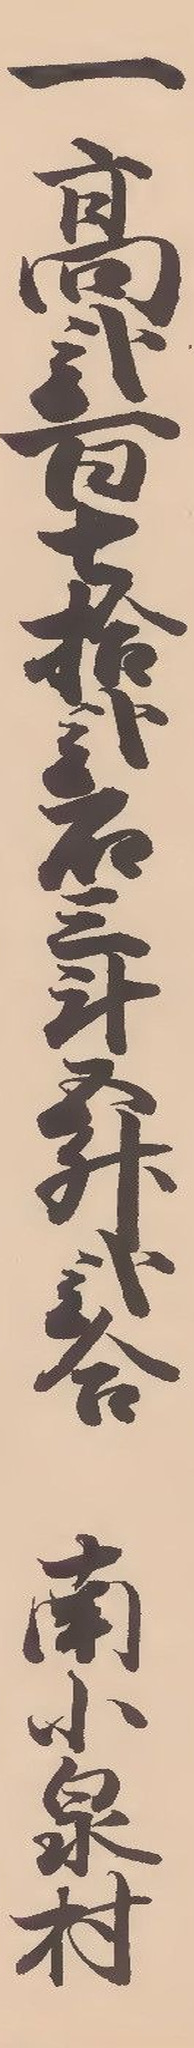一高弐百七拾弐石三斗五升弐合南小泉村
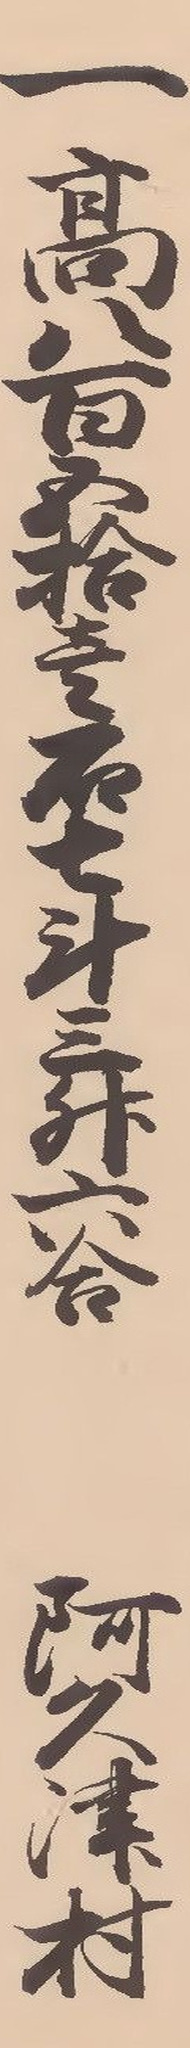一高八百五拾壱石七斗三升六合阿久津村
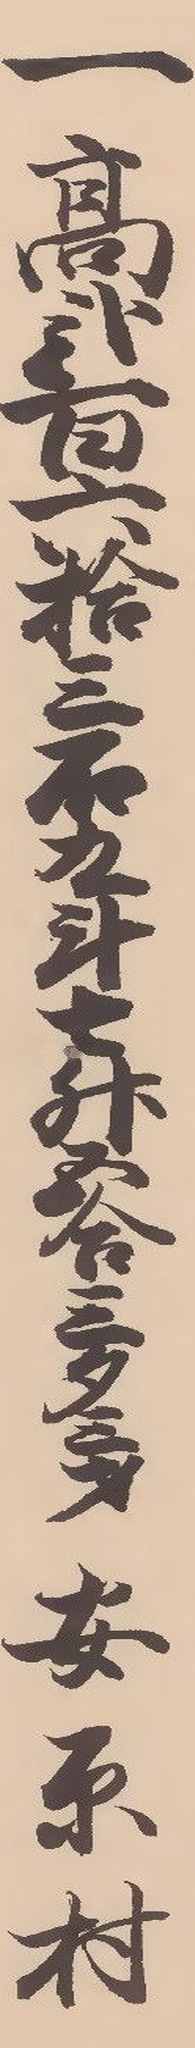一高弐百六拾三石九斗七升五合三勺三才安原村
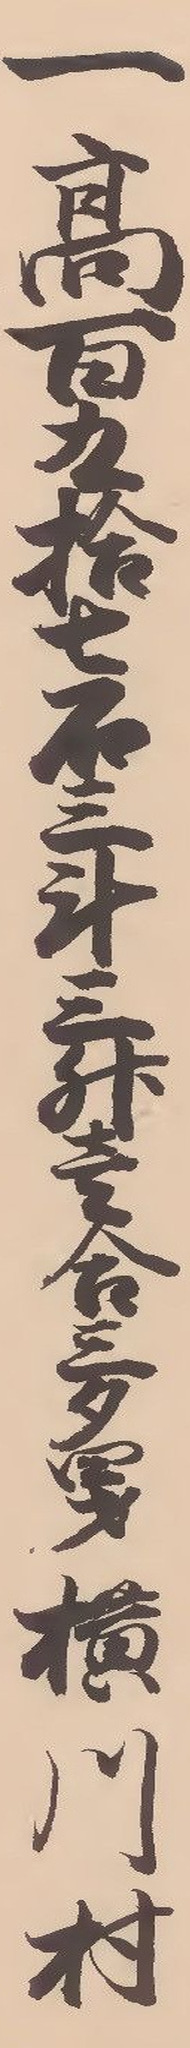一高百九拾七石三斗三升壱合三勺四才横川村
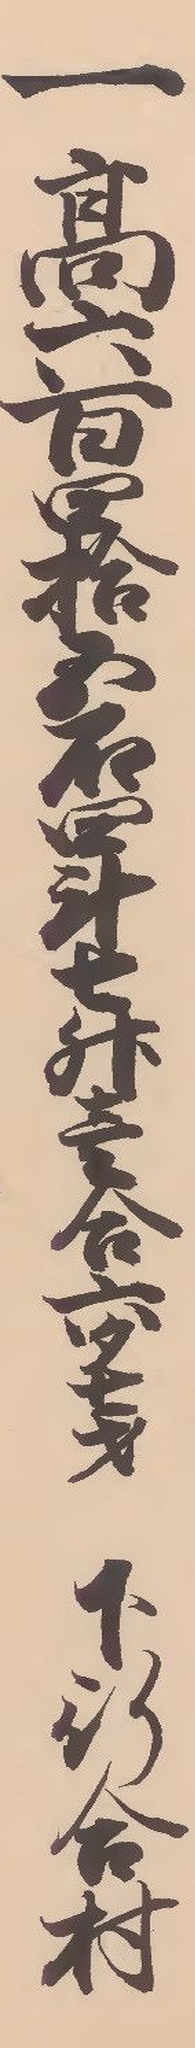一高六百四拾五石四斗七升壱合六勺七才下行合村
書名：陸奥国郷帳　２
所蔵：国立公文書館 National Archives of Japan
